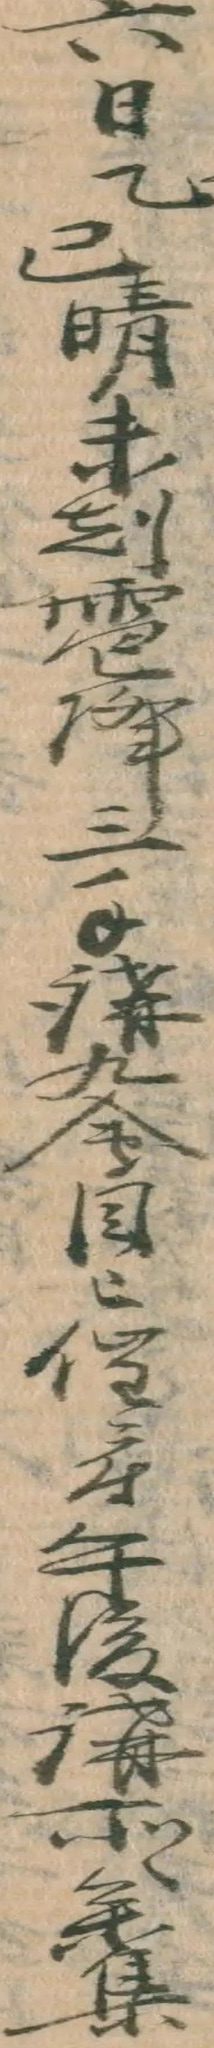六日乙巳晴未刻雹降三手講九會目被催ニ付午後講所へ参集
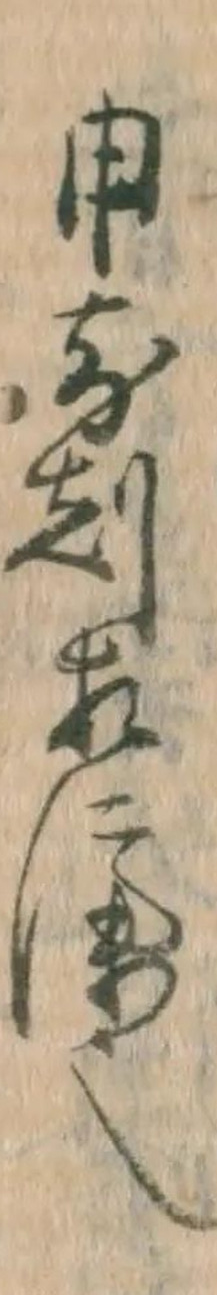申前刻相済也
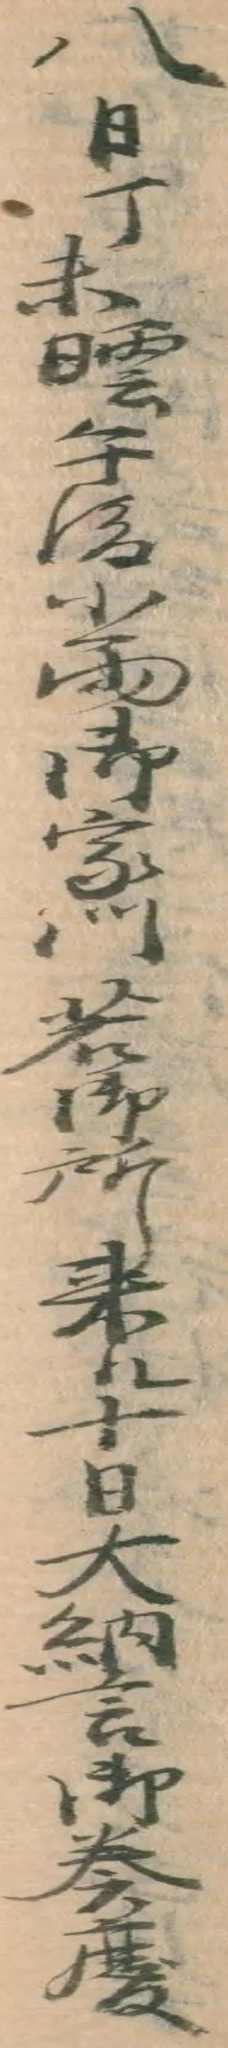八日丁未曇午後小雨御家門若御所来ル十日大納言御奏慶
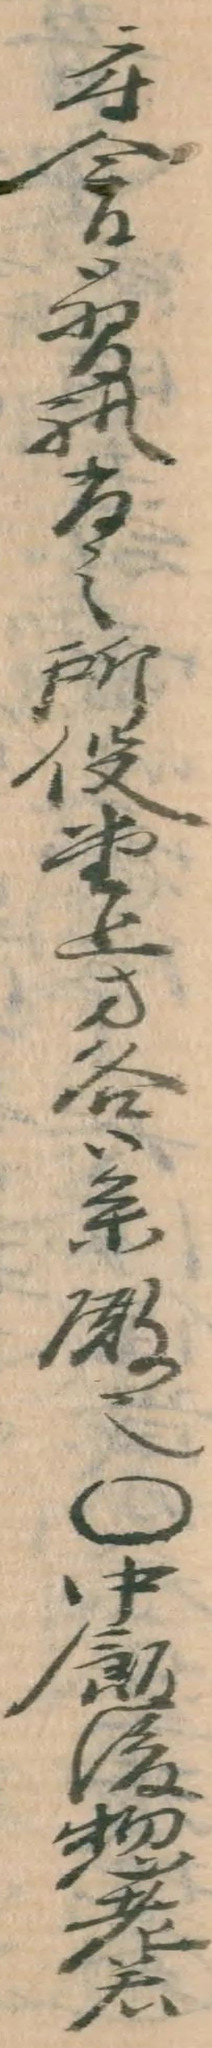ニ付今日御習礼有之所役堂上方各御参殿也○中飯後惣老若
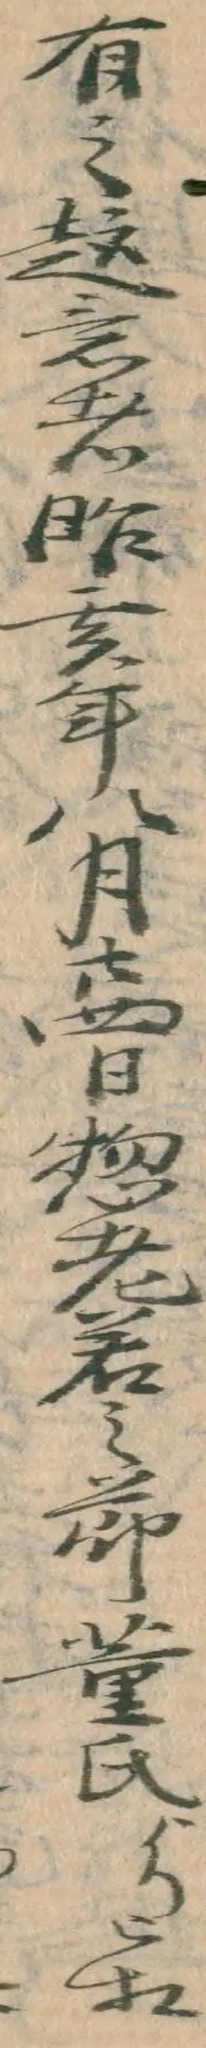有之趣意者昨亥年八月廿四日惣老若之節董氏より被相
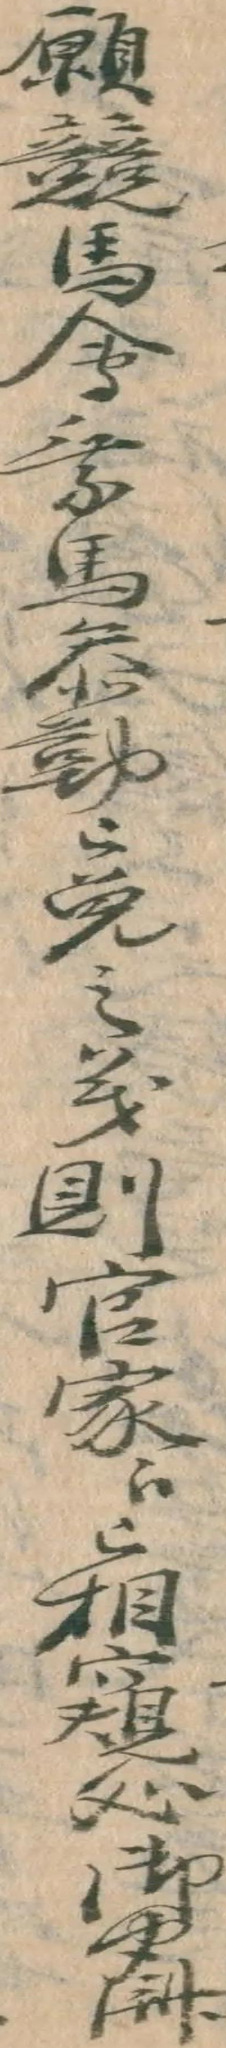願競馬會乗馬参勤被免之義則官家江被相窺処御聞済
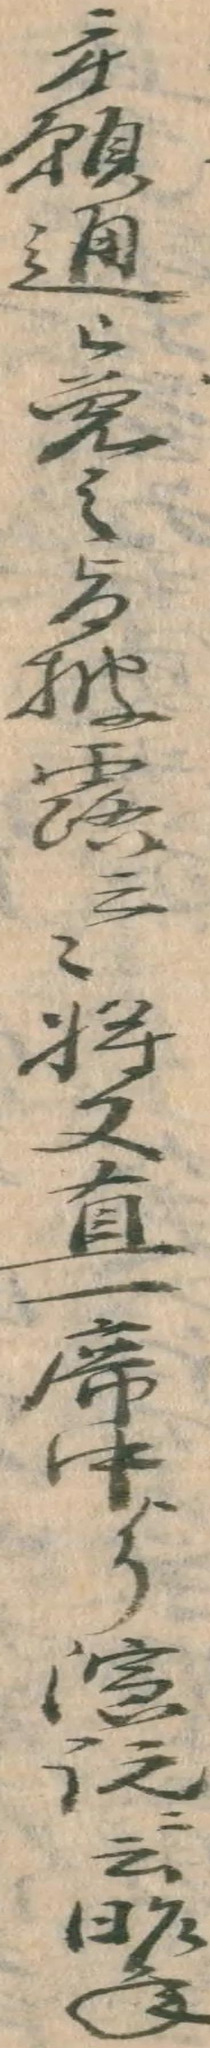ニ付願通被免之旨披露云〻将又直一席中より演説ニ云昨年
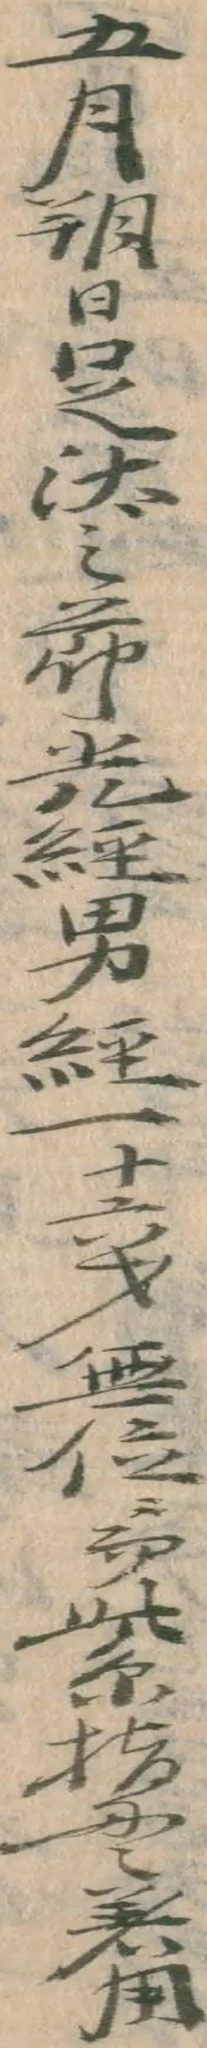五月朔日足汰之節光経男経一十六才無位ニ而紫指貫着用
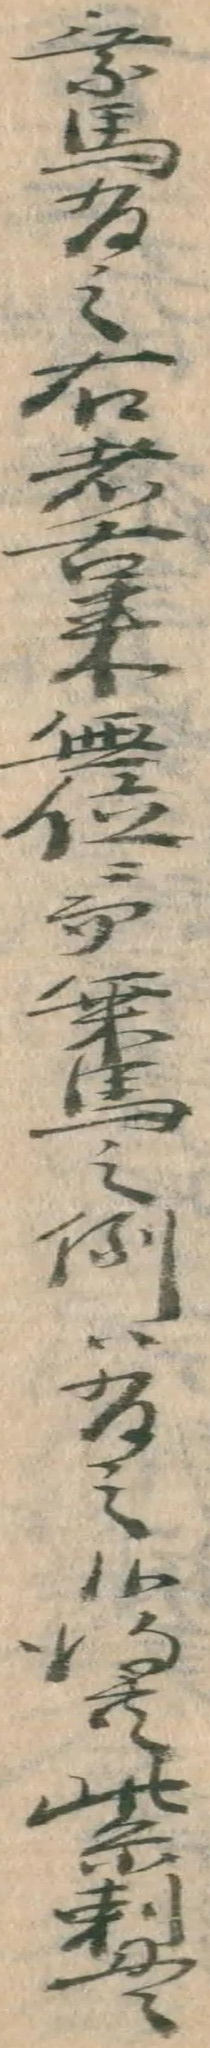乗馬有之右者古来無位ニ而乗馬之例ハ有之候得共紫刺貫
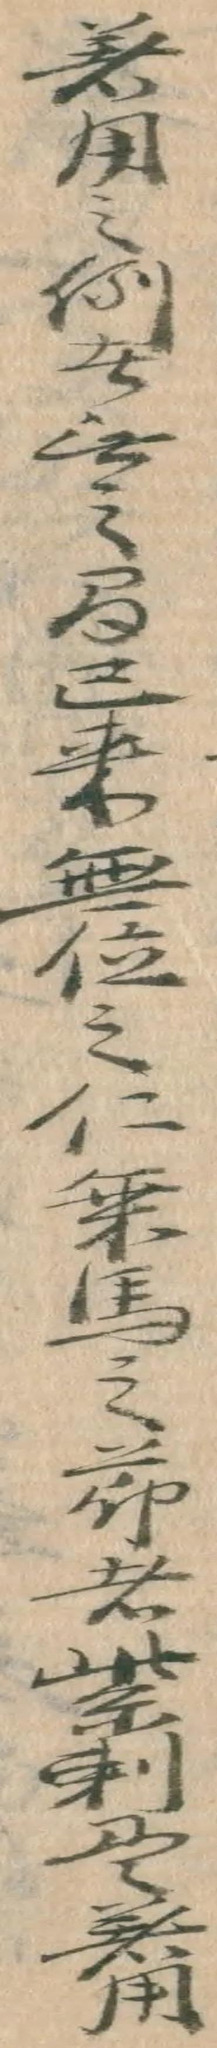着用之例無之間已来無位之仁乗馬之節者紫刺貫着用
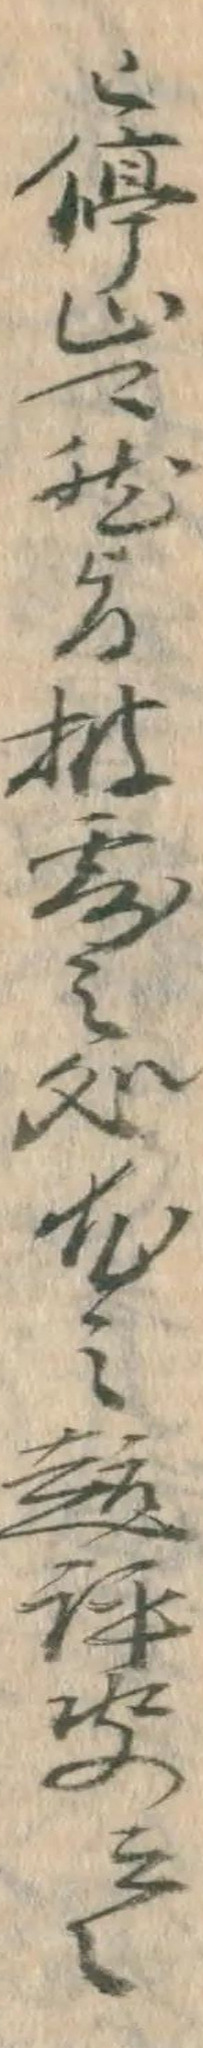被停止可然旨披露之処尤之趣評決云々
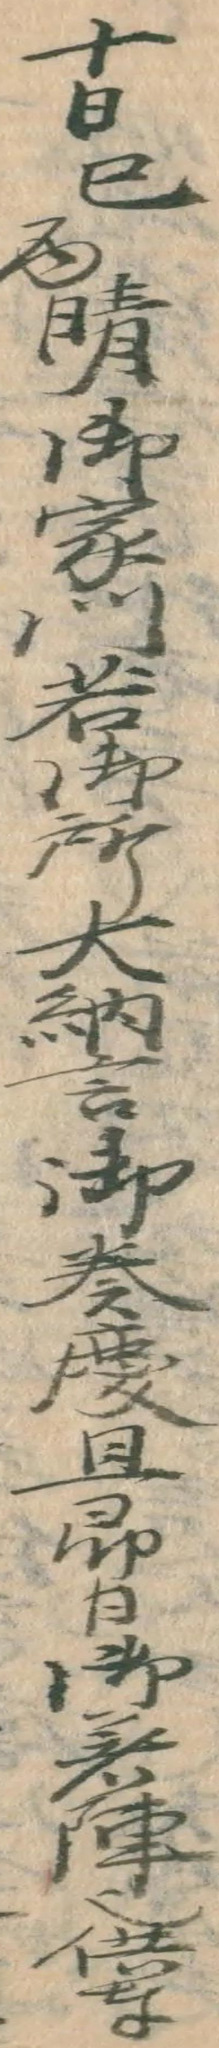十日己酉晴御家門若御所大納言御奏慶且即日御着陣也供奉
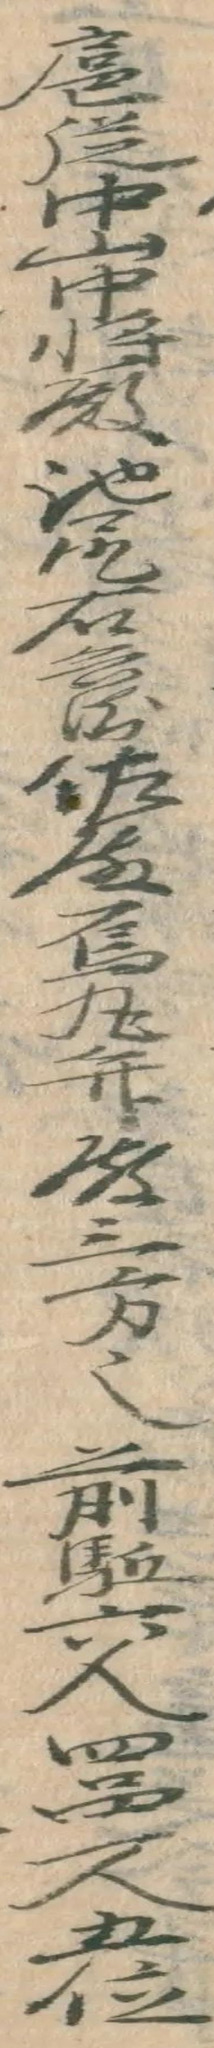扈従中山中将殿池尻右兵衛佐殿烏丸并殿三方也前駈六人四品一人五位
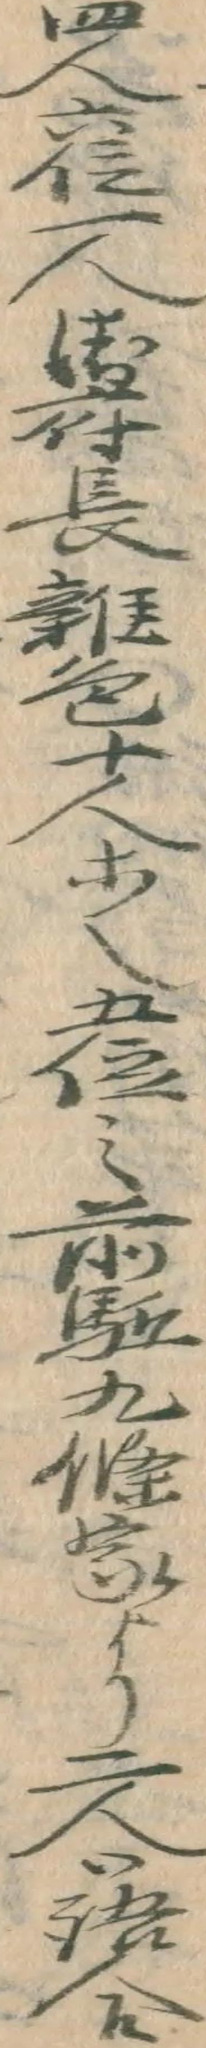四人六位一人衛府長雑色十人等之五位之前駈九條家より二人御詰合
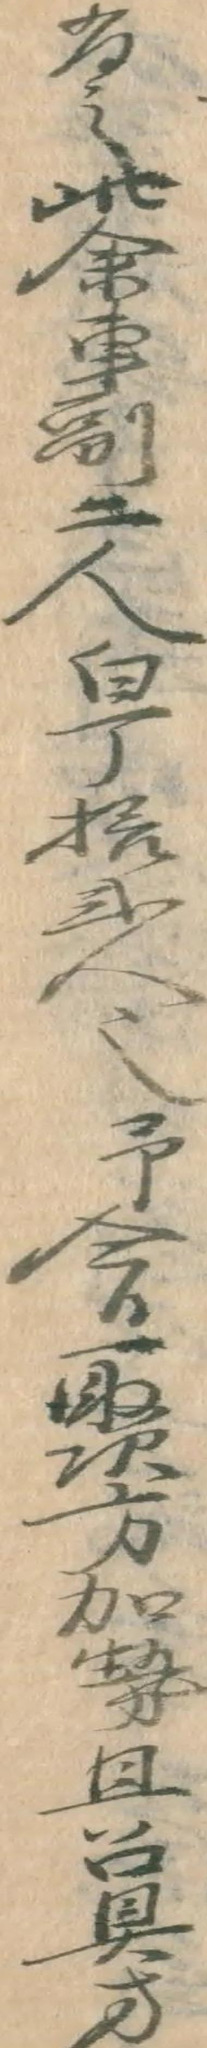有之此余車副二人白丁拾弐人也予今日取次方加勢且召具方

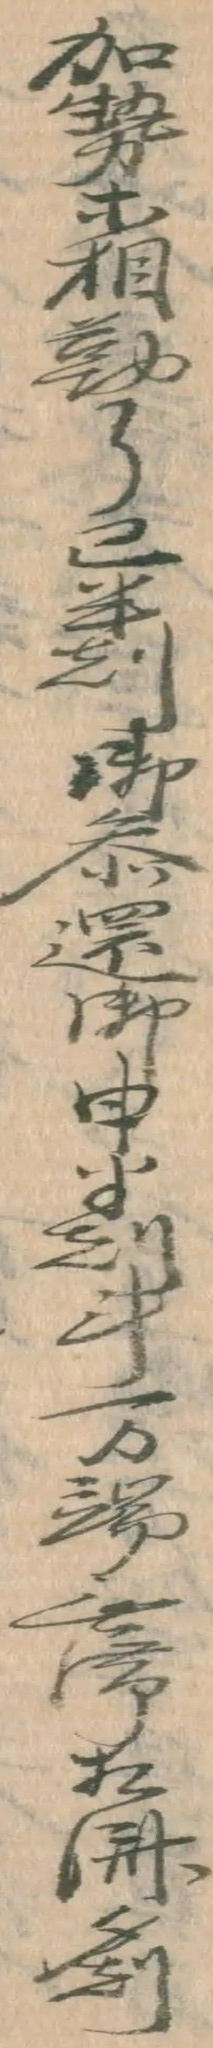加勢等相勤了巳半刻御参還御申半刻斗万端無滞相済夕刻
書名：賀茂社記録. 第65冊
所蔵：国立国会図書館 National Diet Library, JAPAN
